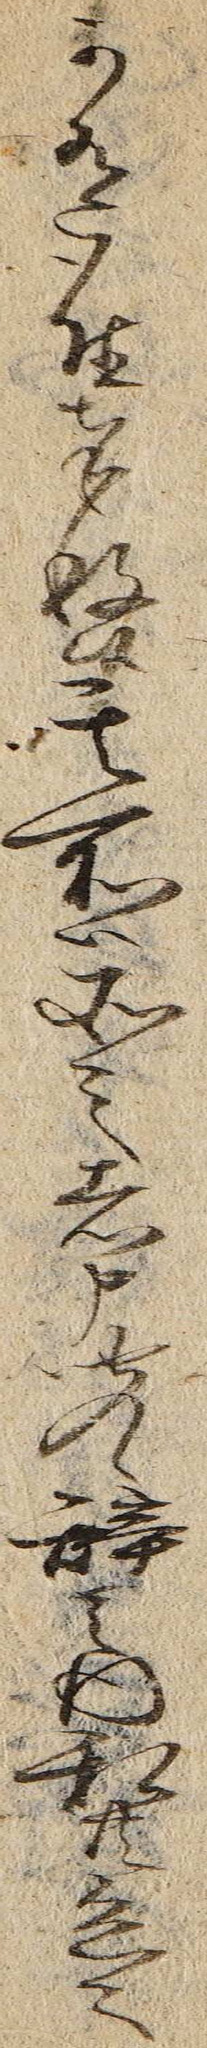可有御座奉存候其所は所の者申聞候辞の内私ども色々
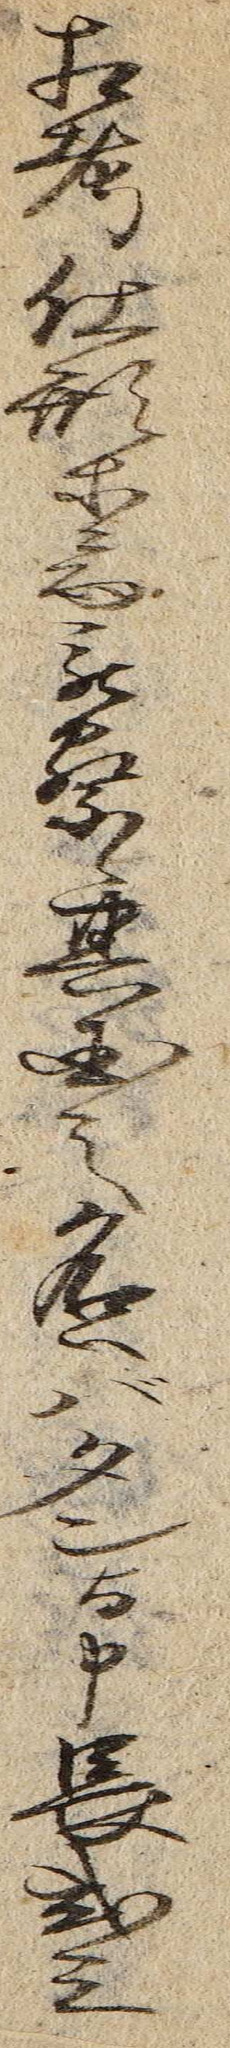相考仕形等にて被察候其国の名はバタンと申長二三
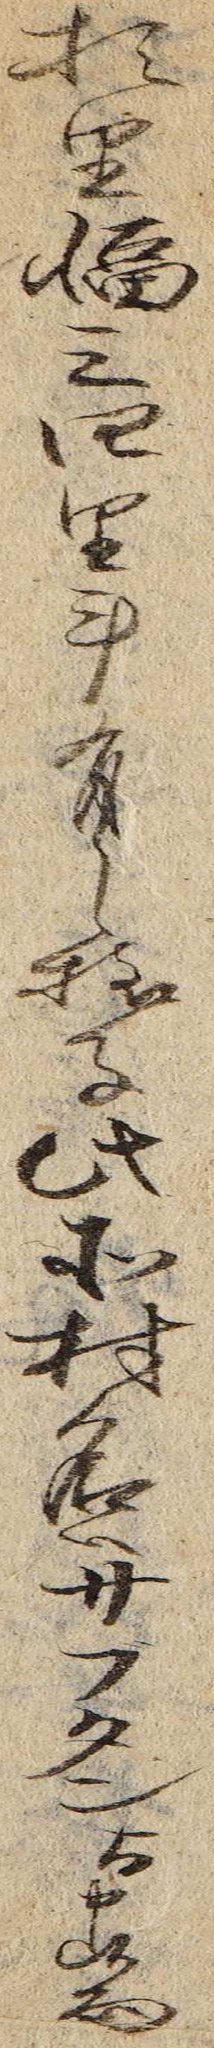十里幅三四里斗有之様子此所村名はサブタンと申候て
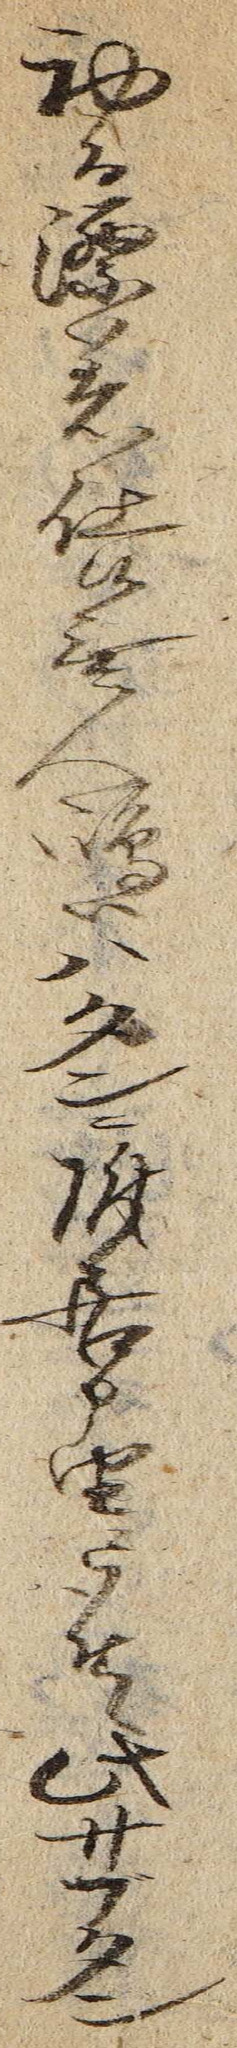初て漂着仕候無人島はハタンに付居申由御座候此サブタン

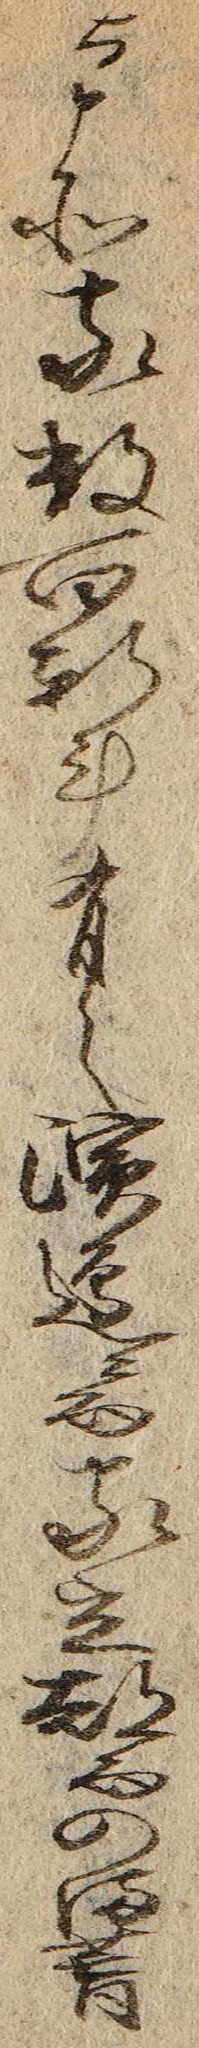と申処家数百軒斗有之浜辺にて家立都てのま葺
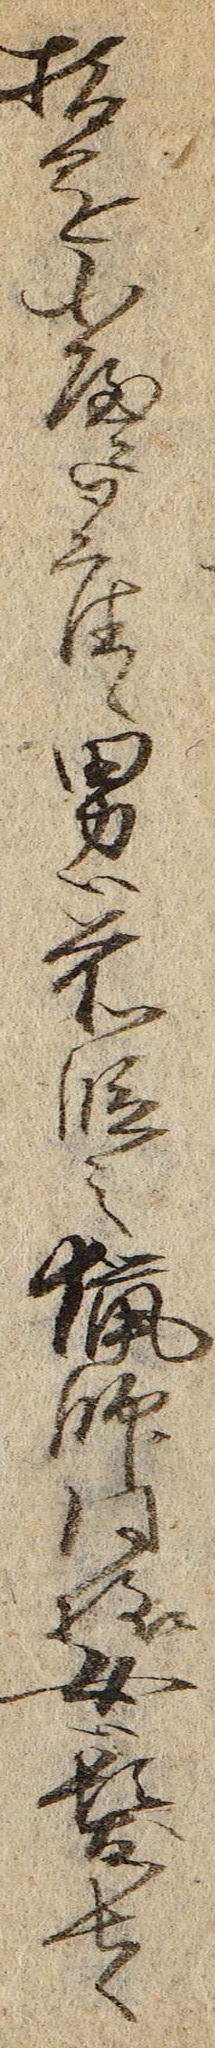指懸小屋に御座候男は前段の漁師同様女は髪長く
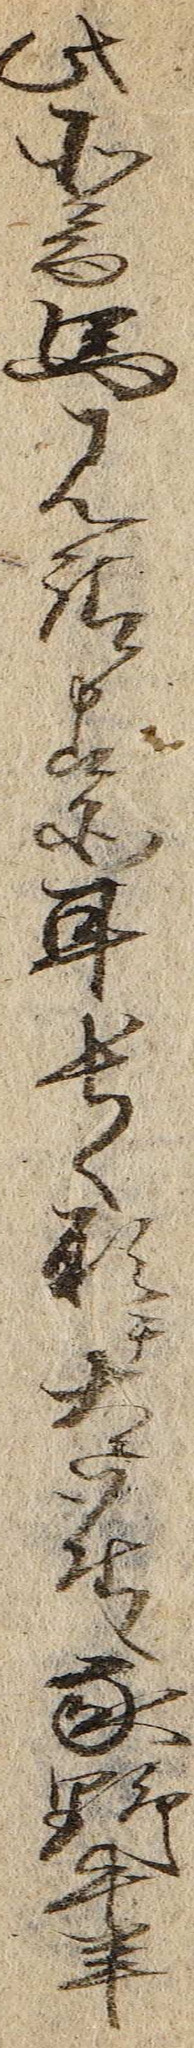此所にて馬見請申候所耳長く形チ大に御座候豕野牛羊
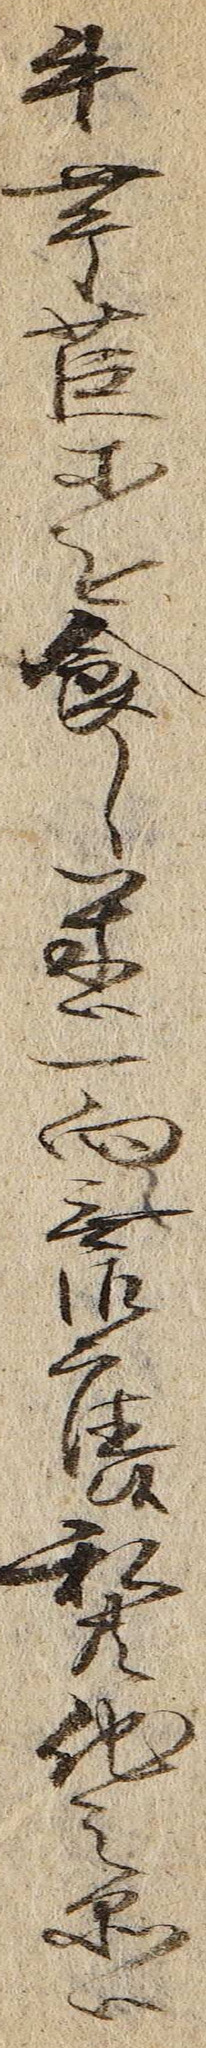牛芋苣等を食し米は一向無御座候私ども他の品は
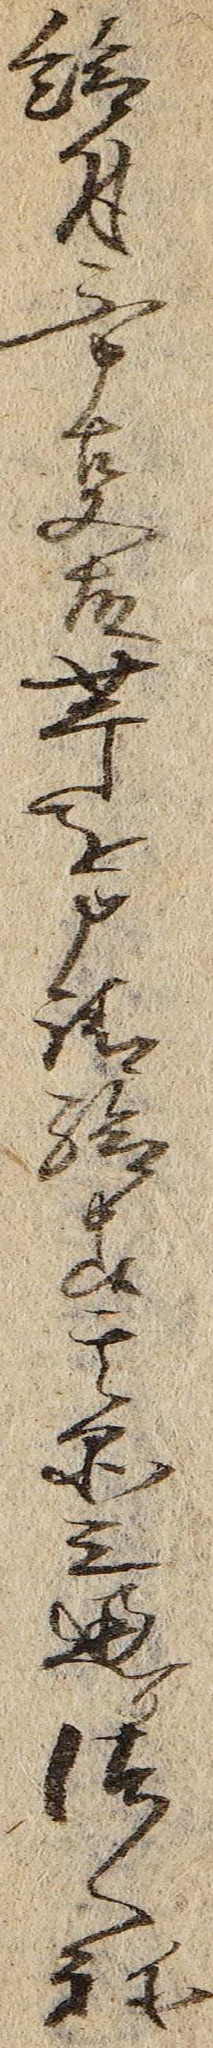給付不申事故芋を申請給申候其品三通りつくね
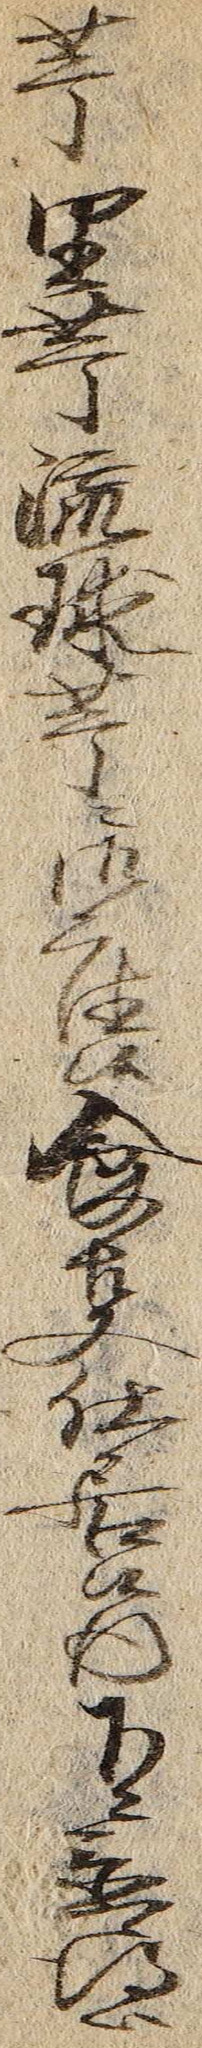芋里芋琉球芋に御座候食事仕居候内下に置候得は
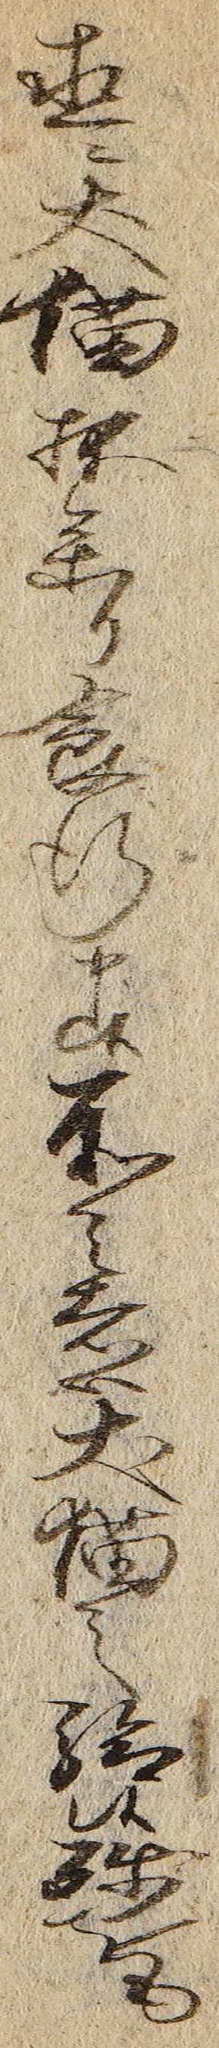直に犬猫など参り食行申候所の者は犬猫の給候残をも
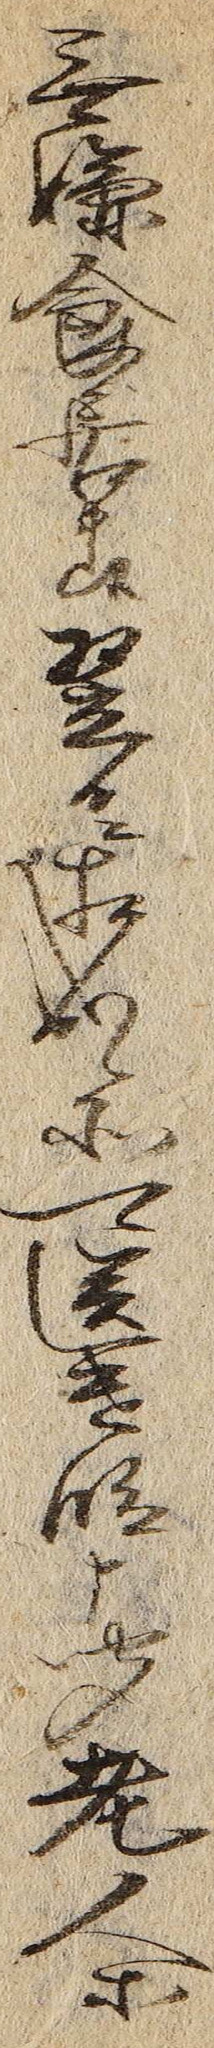無嫌食居申候翌日に相成候所可送遣段申聞老人等
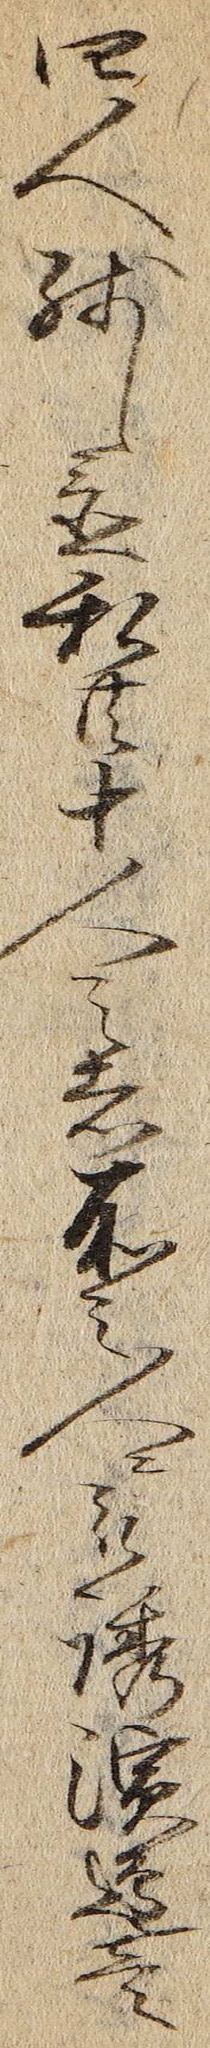四人残し置私ども十人の者所の人々に被誘浜辺一
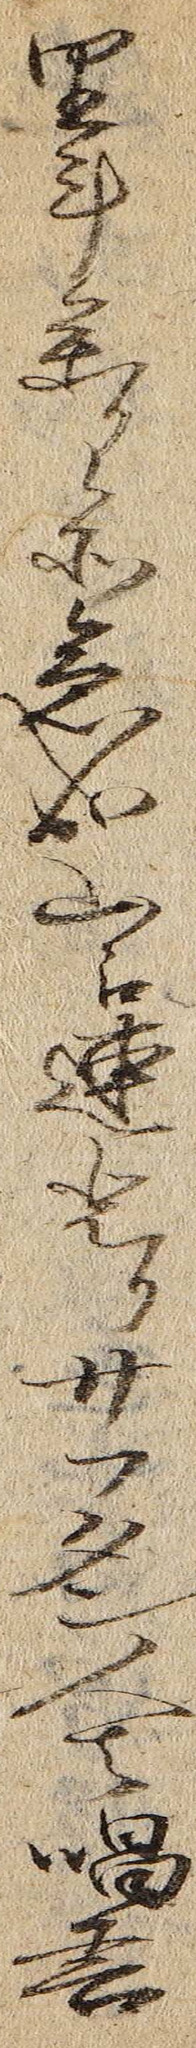里斗参り候所急なる山へ連登りサフタン人は唱言
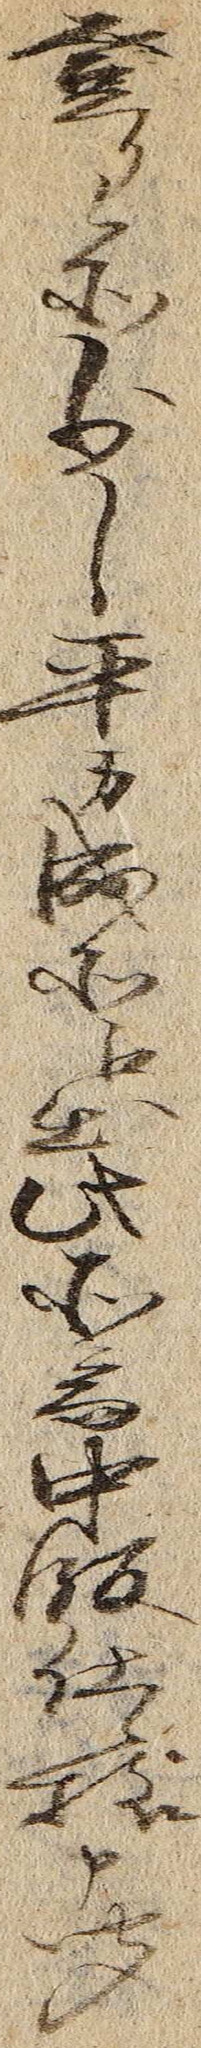登り候所少し平カなる所へ出此所にて中飯仕候様申聞
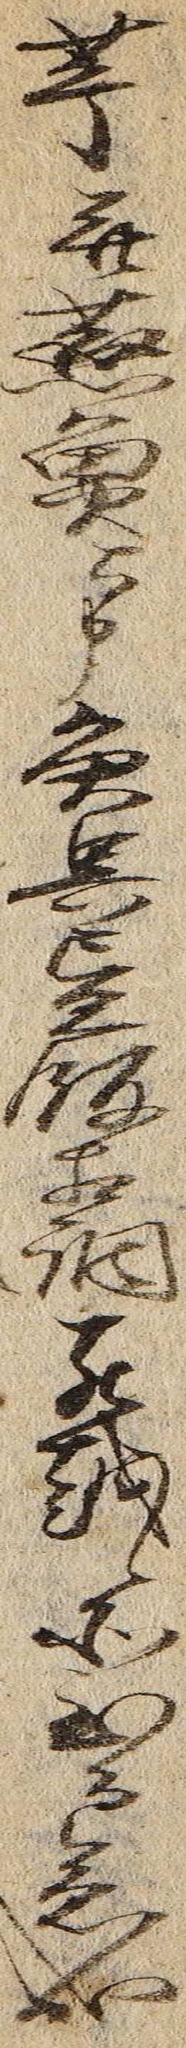芋幷蒸魚と申魚呉昼飯相調罷越候所至る急なる
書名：能登国清兵衛異国江漂流之始末
